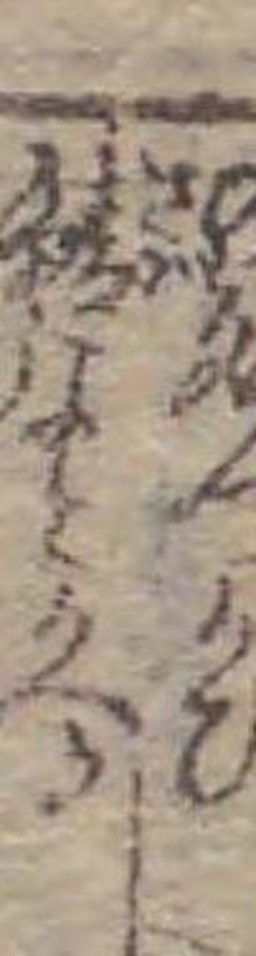鯖よとかへる
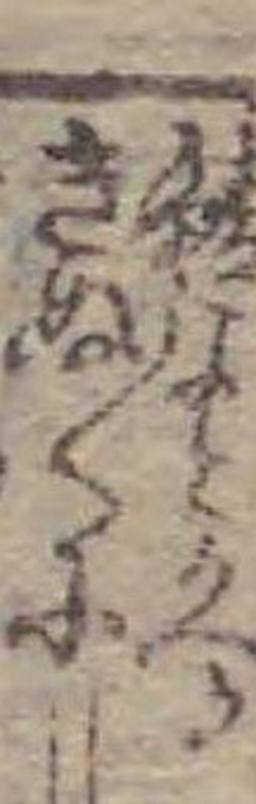きぬ〳〵に
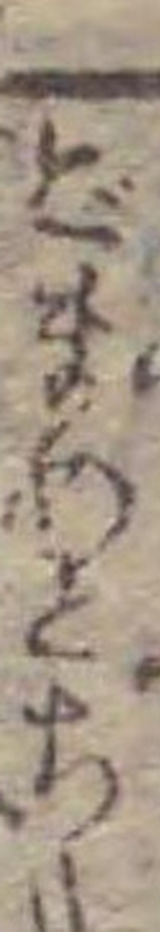ごまめをち
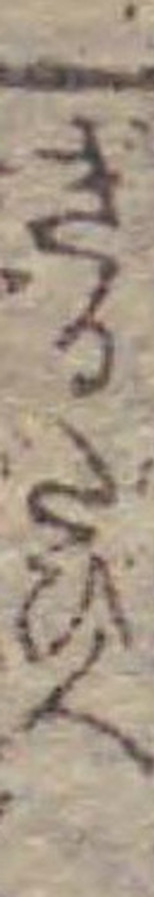ぎるたび人
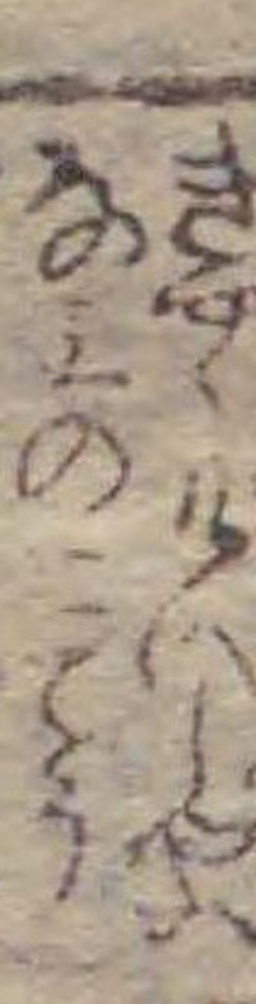なみの二てう
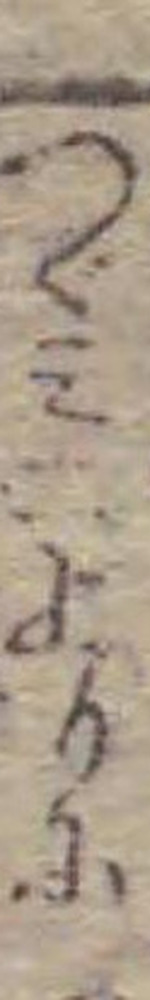つゞみ二上りに
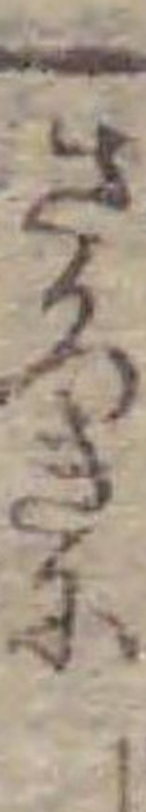さかつきに
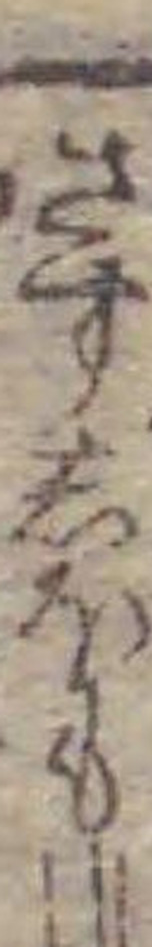さすしほも
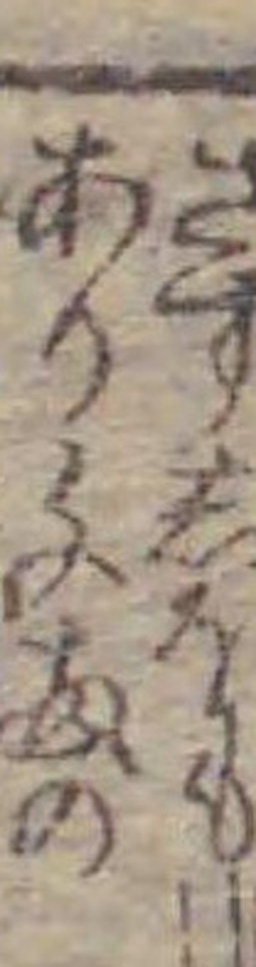あり千両の
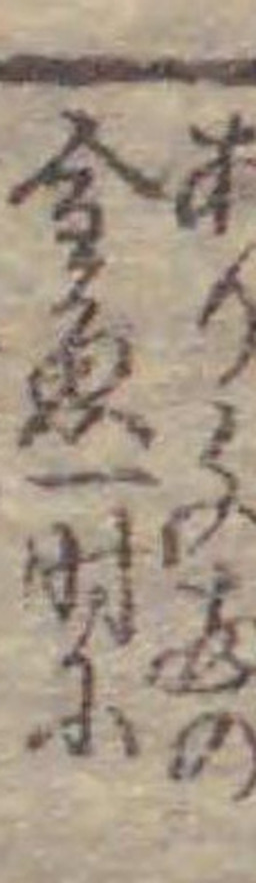金魚一時に
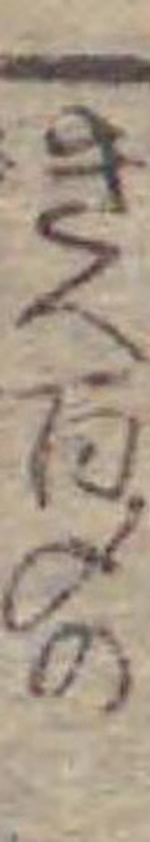きへ百貫の
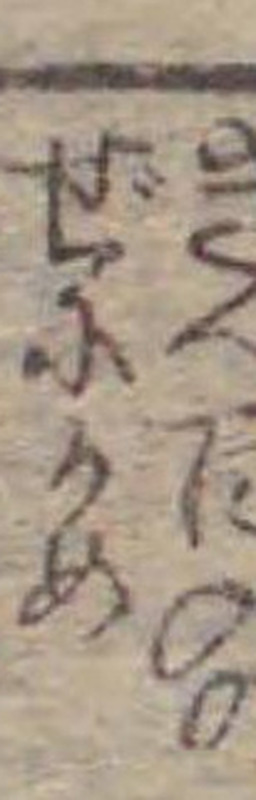ぜにかめ
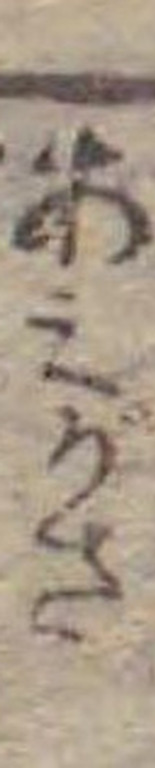あみがさ
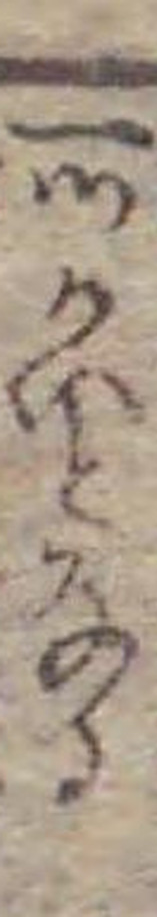一つかいとなる
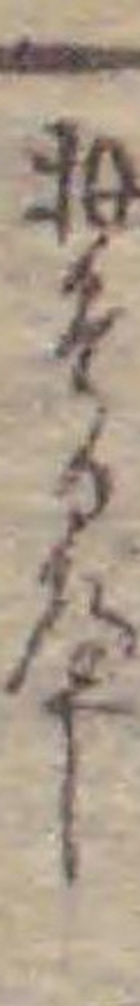おそるべし

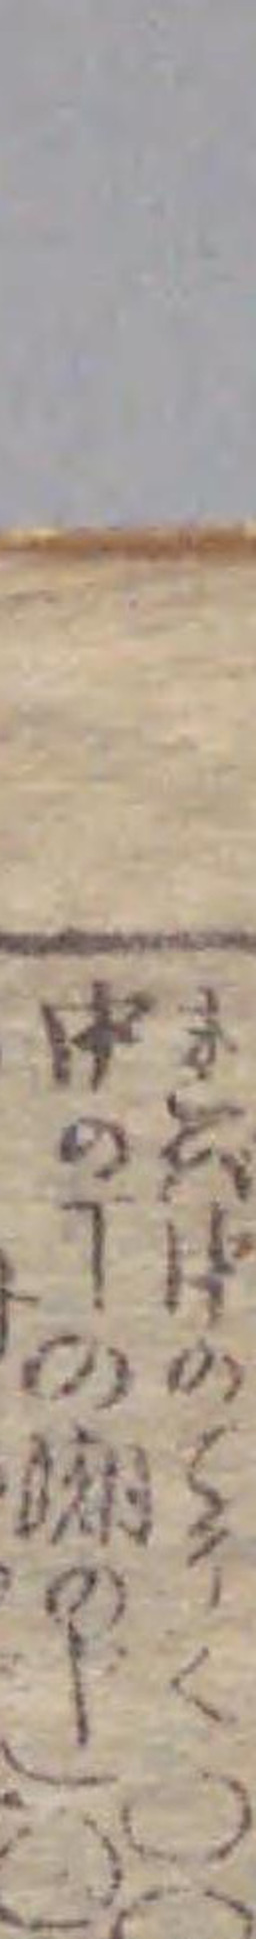中の丁の潮のじ
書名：竜宮苦界玉手箱 : 3巻
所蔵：国立国会図書館 National Diet Library, JAPAN
